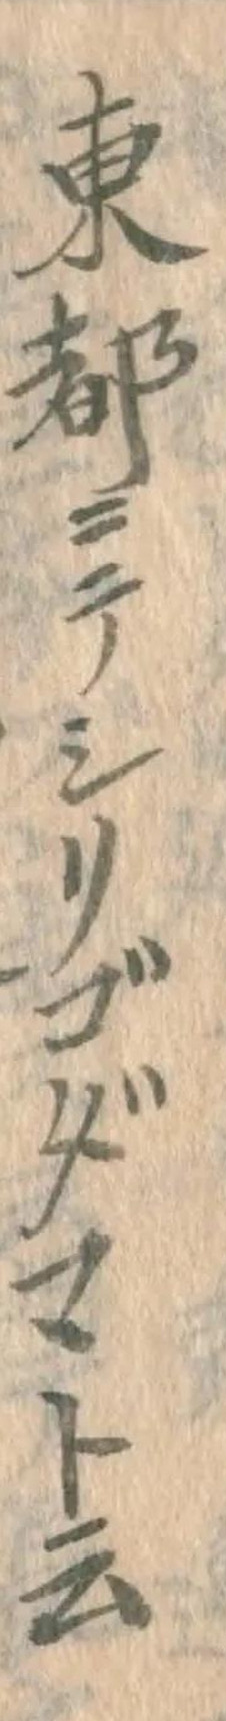東都ニテシリゴダマト云
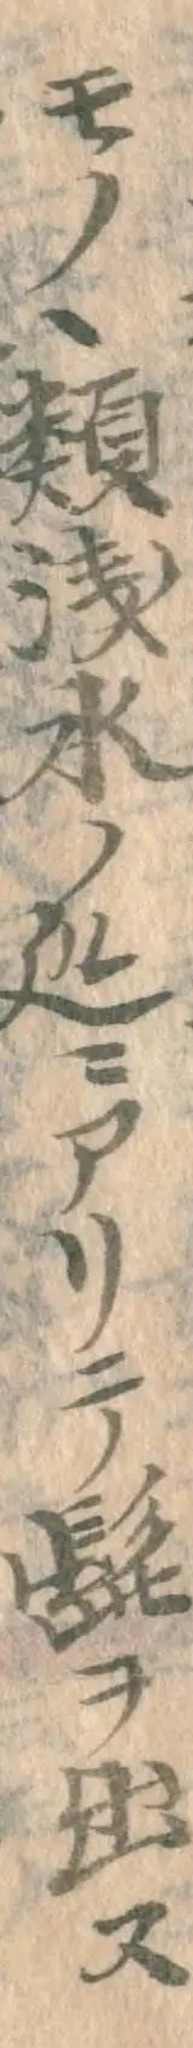モノヽ類浅水ノ処ニアリテ髭ヲ出ス
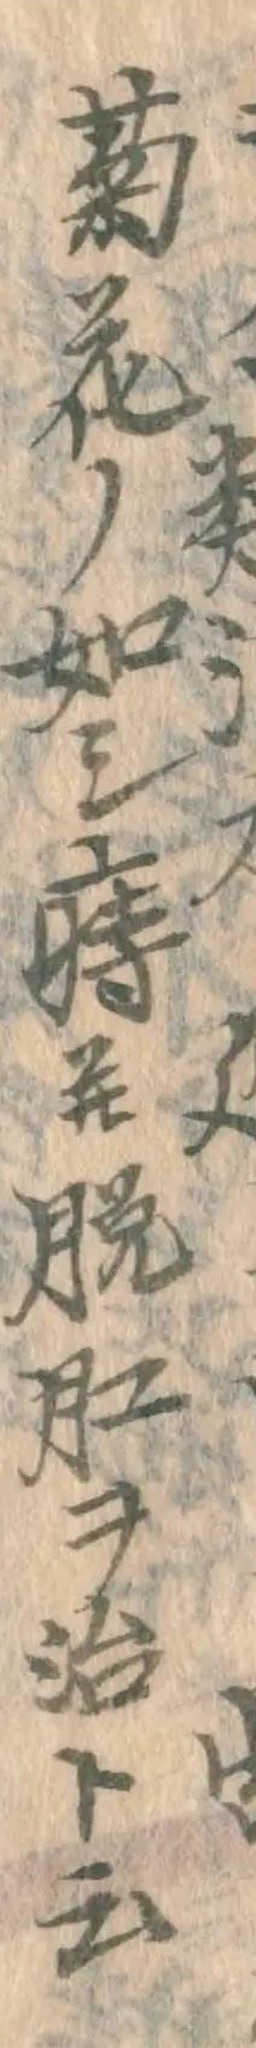菊花ノ如シ痔并脱肛ヲ治ト云

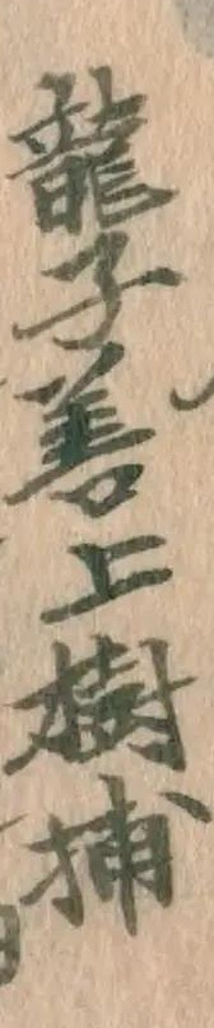龍子善上樹捕
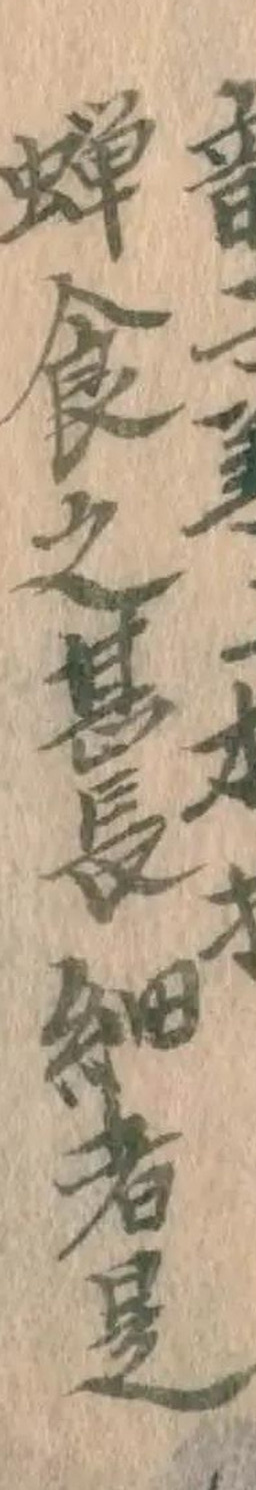蝉食之甚長細者是
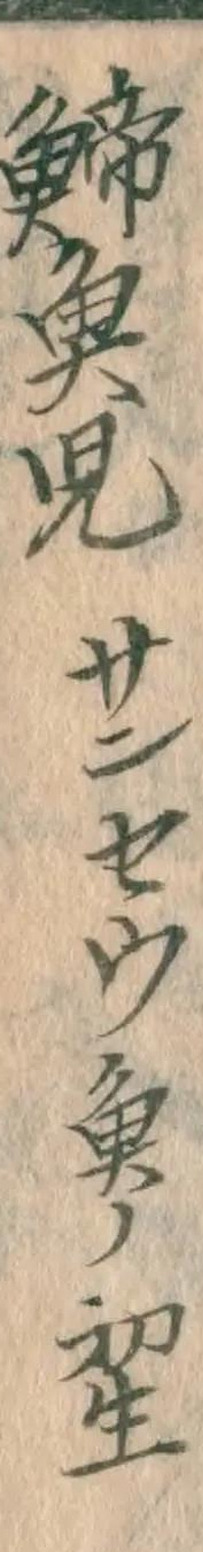䱱魚児サンセウ魚ノ初生
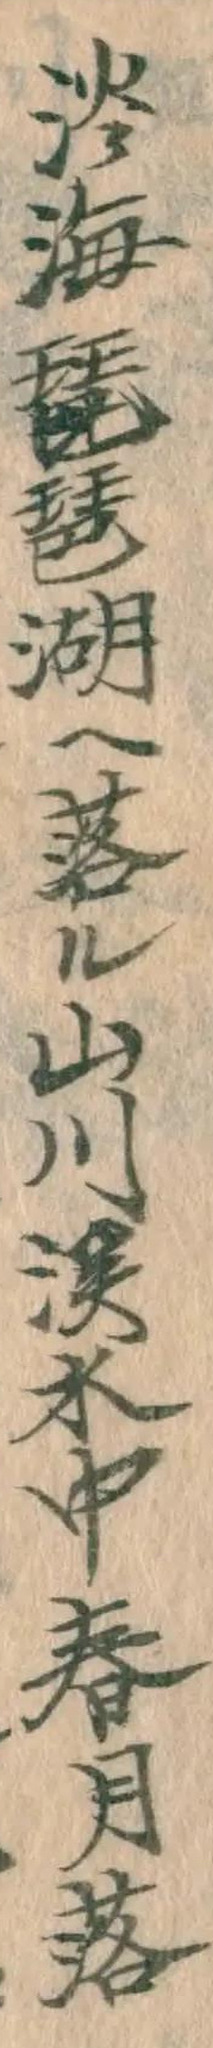淡海琵琶湖ヘ落ル山川渓水中春月落
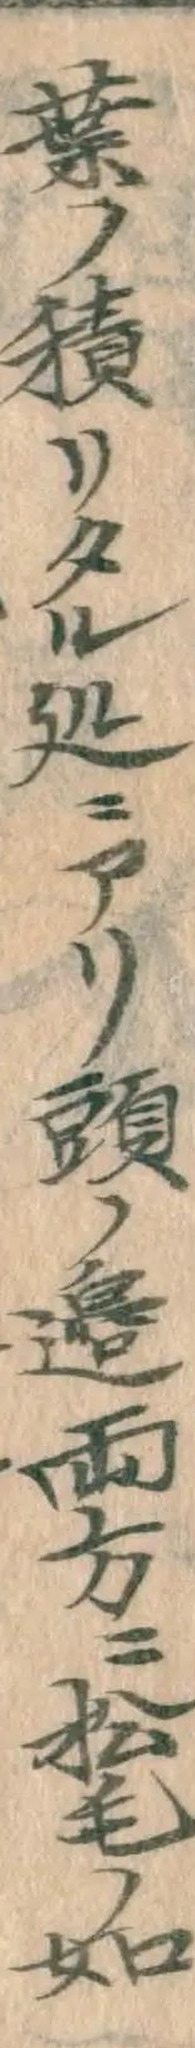葉ノ積リタル処ニアリ頭ノ辺両方ニ松毛ノ如
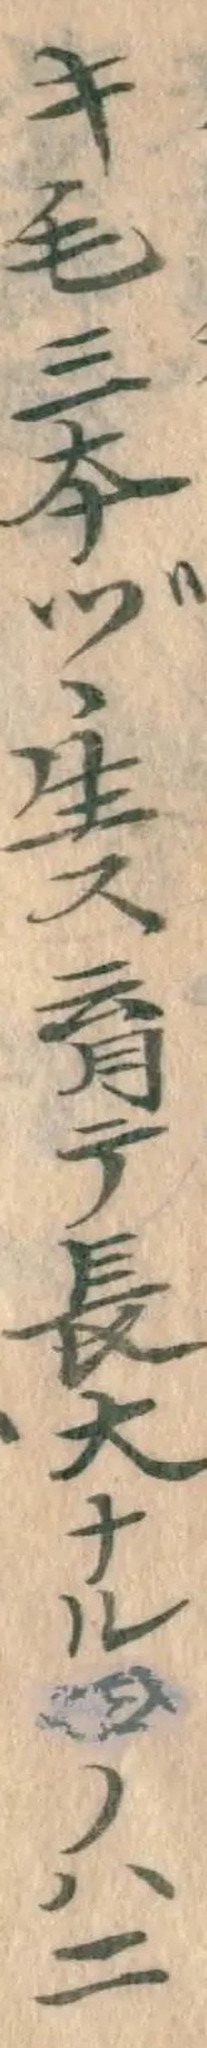キ毛三本ヅヽ生ス育テ長大ナルノハ二
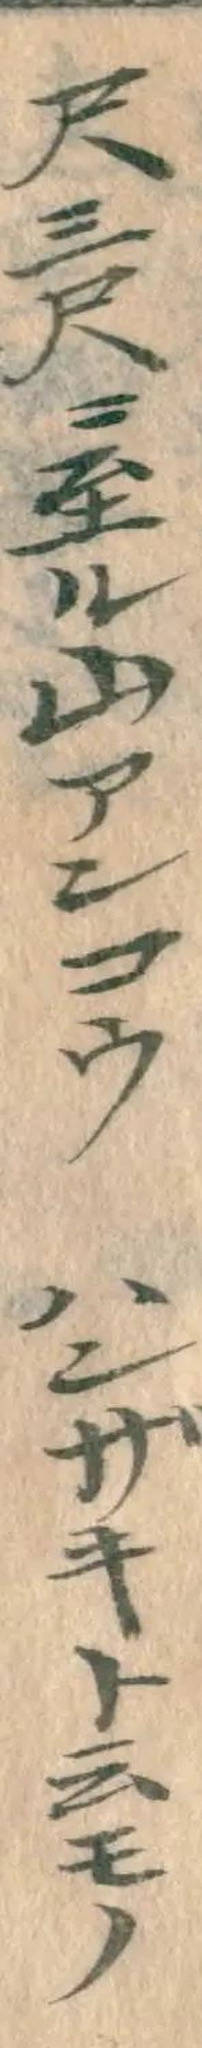尺三尺ニ至ル山アンコウハンザキト云モノ
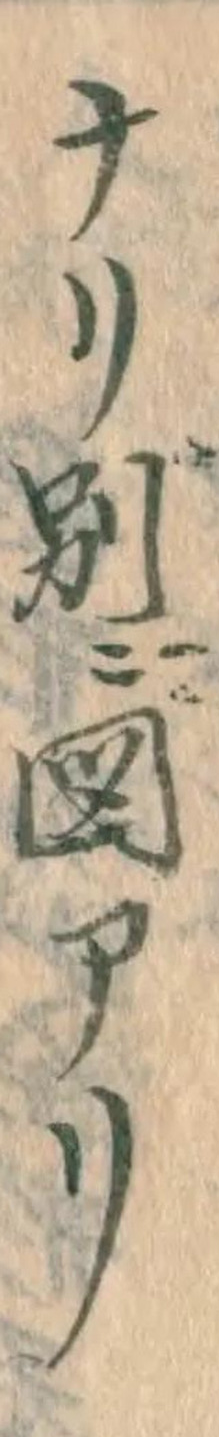ナリ別ニ図アリ

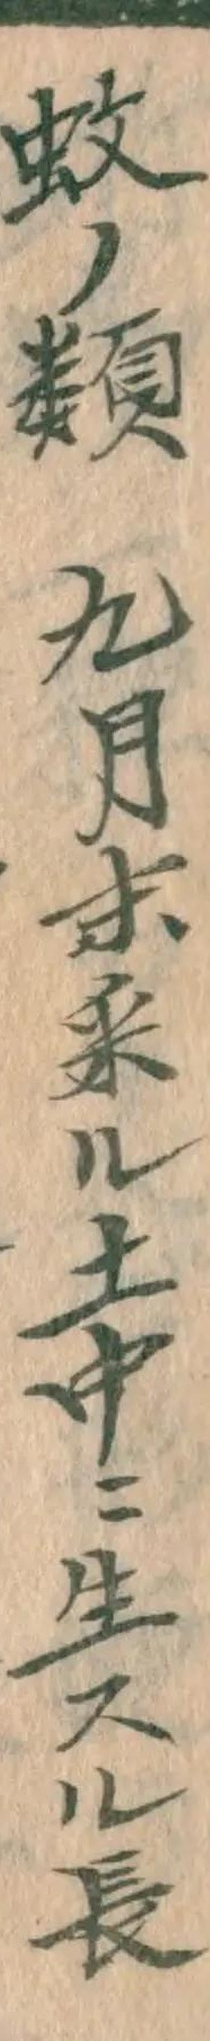蚊ノ類九月末釆ル土中ニ生スル長
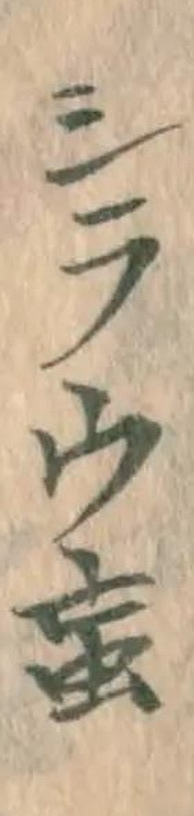シラウ䖟
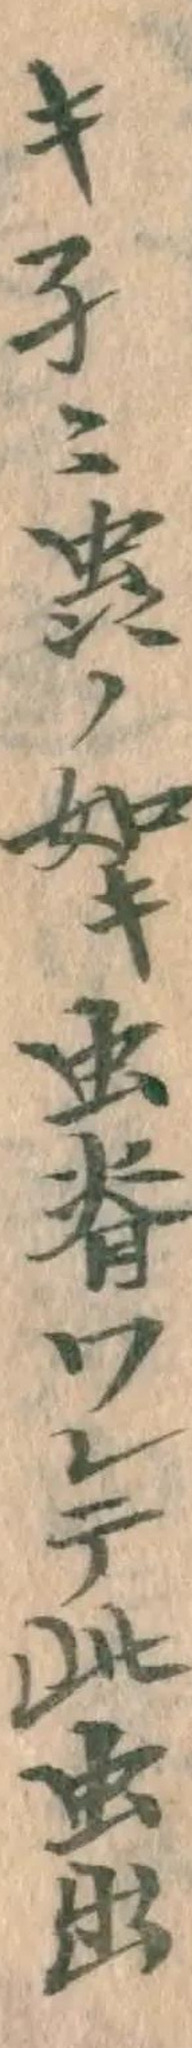キ孑々蟲ノ如キ虫脊ワレテ此虫出
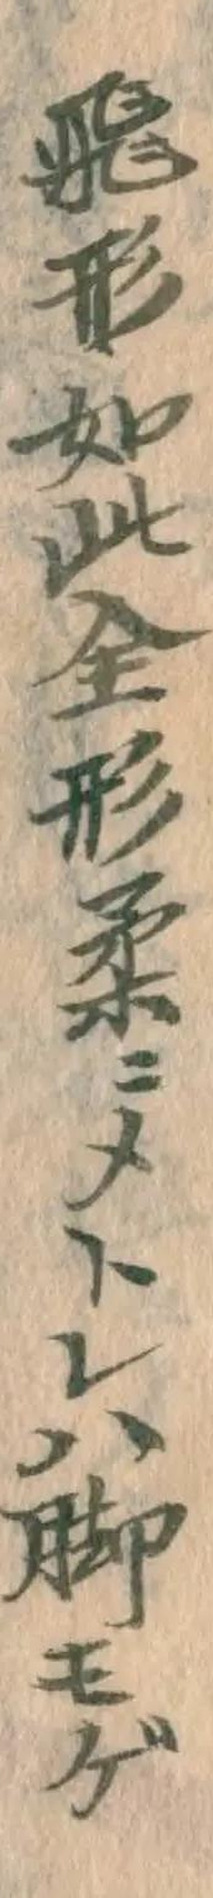飛形如此全形柔ニシテトレハ脚モゲ
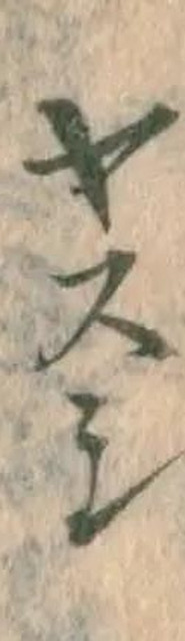ヤスシ
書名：千蟲譜 3巻. [3]
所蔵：国立国会図書館 National Diet Library, JAPAN
